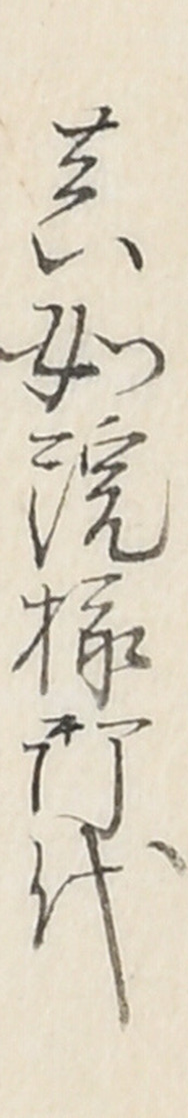真如院様御代
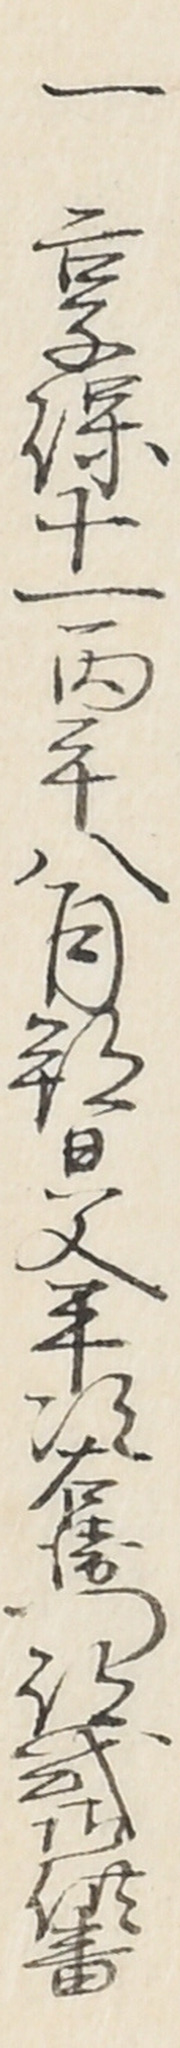一享保十一丙午八月朔日父平次右衛門跡式御供番
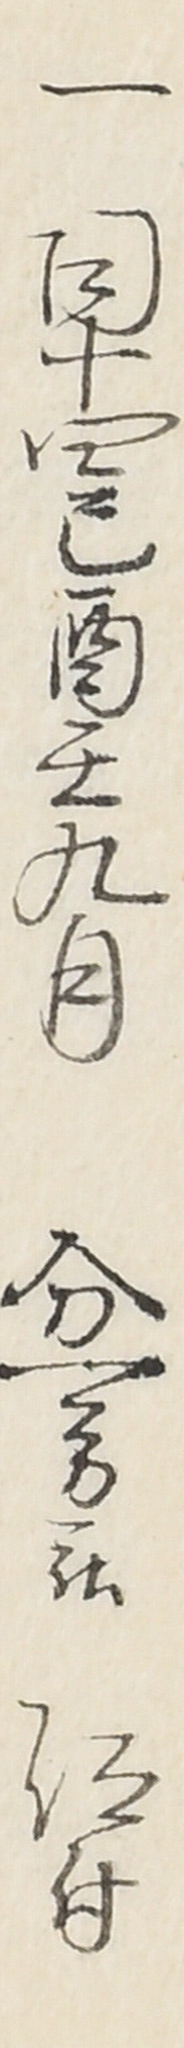一同十四己酉閏九月分一方被仰付
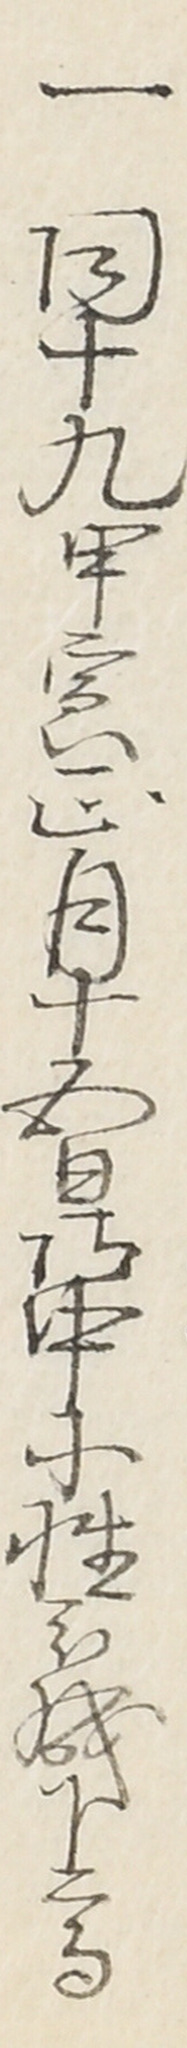一同十九甲寅正月十五日御中小性被成下高
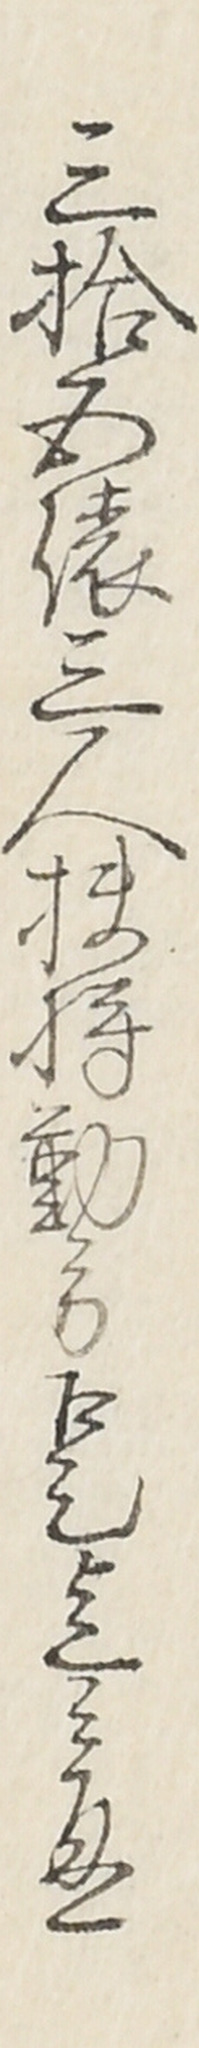三拾五俵三人扶持勤方是迄之通
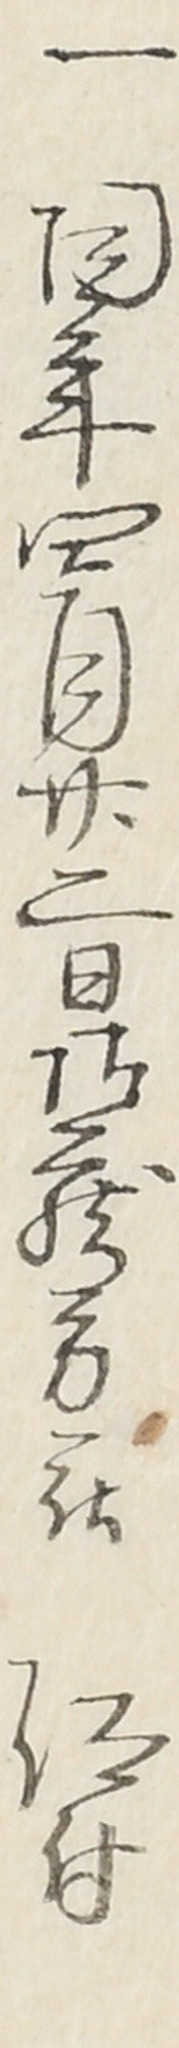一同年四月廿二日御蔵方被仰付
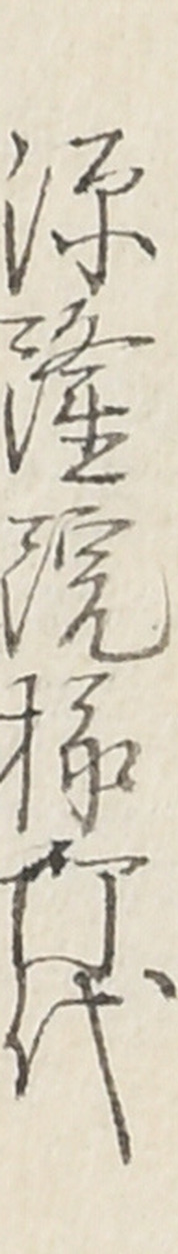源隆院様御代
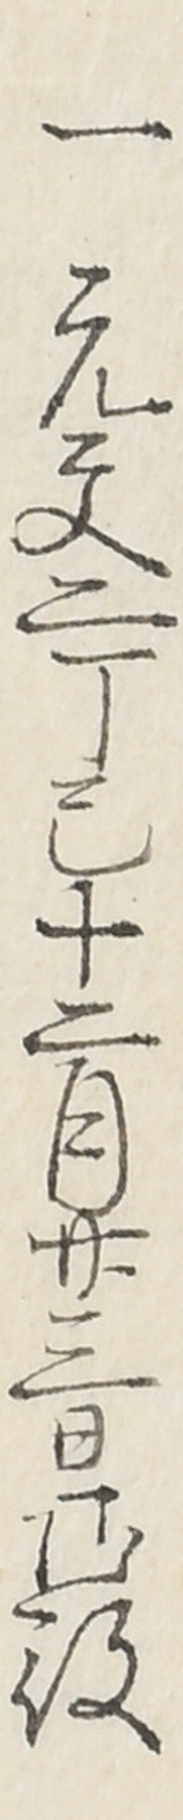一元文二丁巳十二月廿三日御役
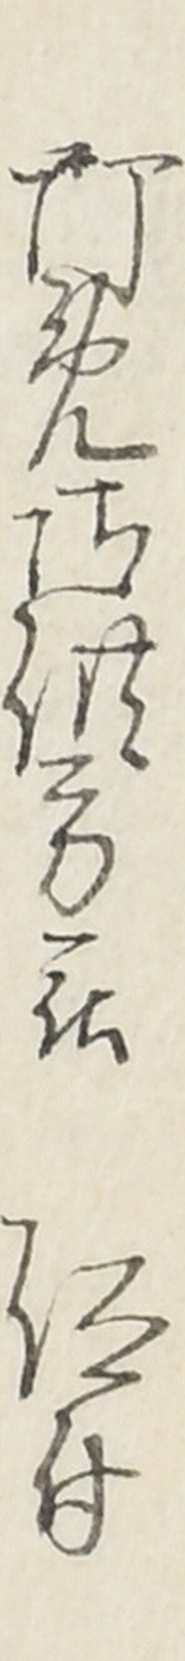御免御供方被仰付
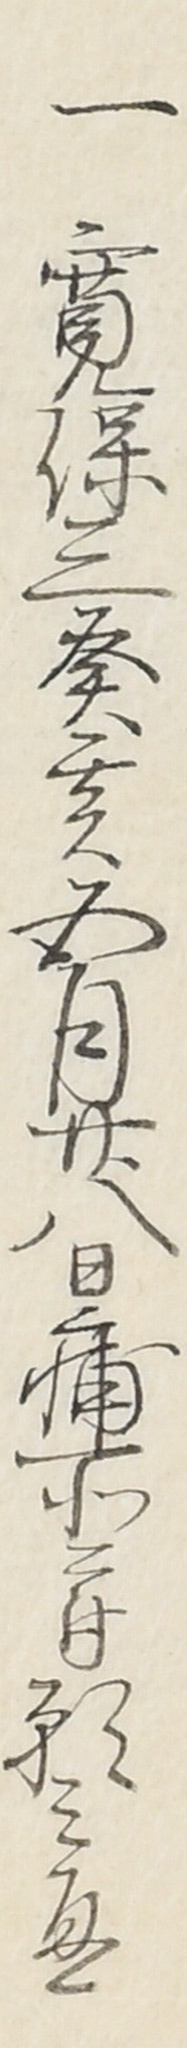一寛保三癸亥五月廿八日痛所ニ付願之通
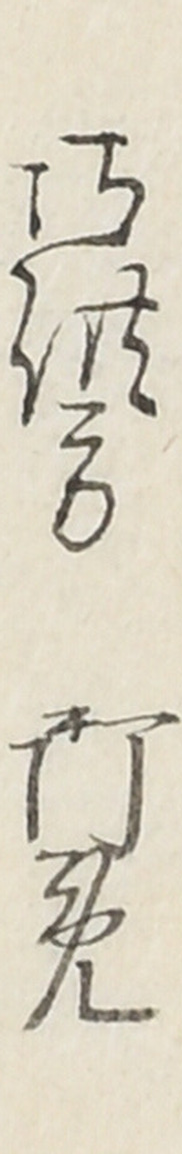御供方御免
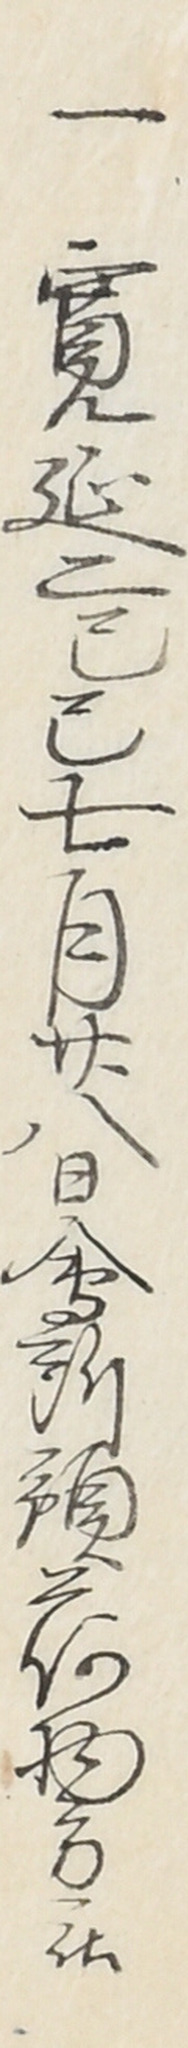一寛延二己巳七月廿八日会所預荷物方被
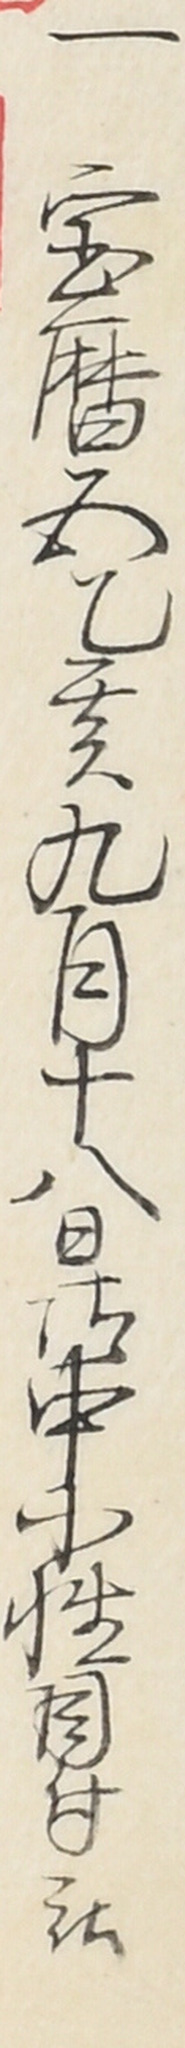一宝暦五乙亥九月十八日御中小性目付被

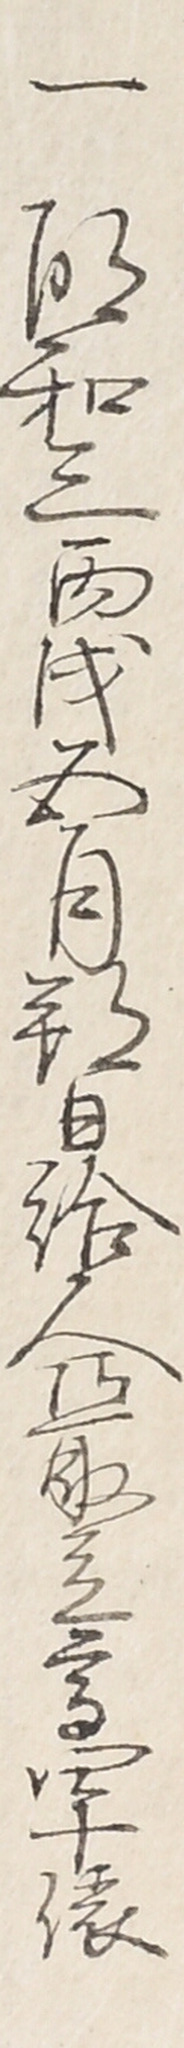一明和三丙戌五月朔日給人御取立高四十俵
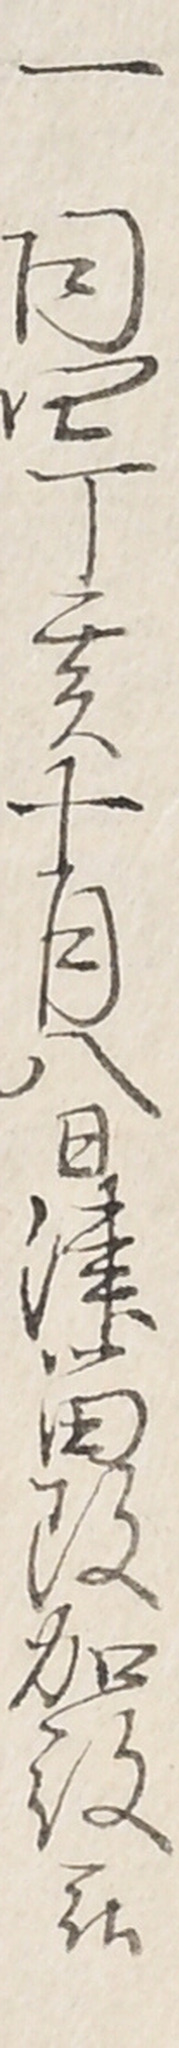一同四丁亥十月八日津留改加役被
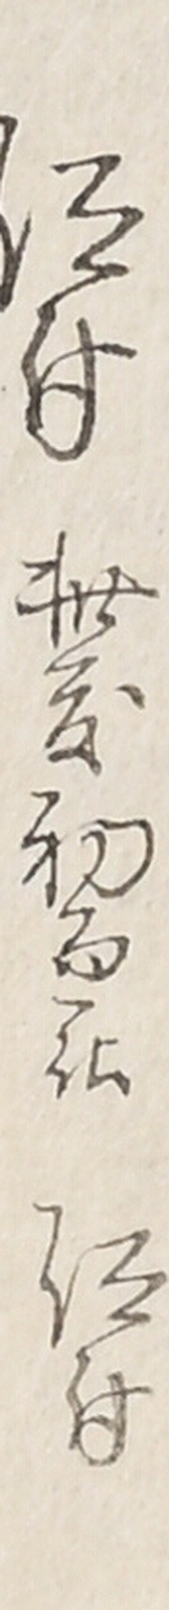仰付此度初而被仰付
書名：給人諸士勤仕録（七）
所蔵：伊那市立高遠町図書館・合同会社AMANE
